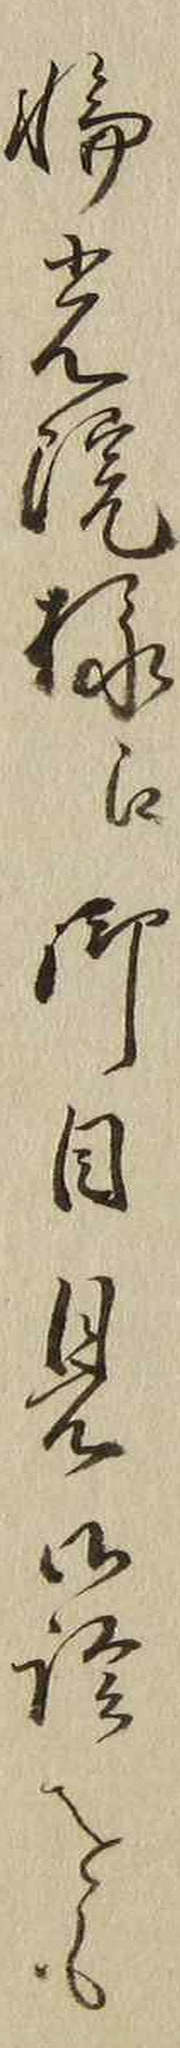輪光院様江御目見御診をも
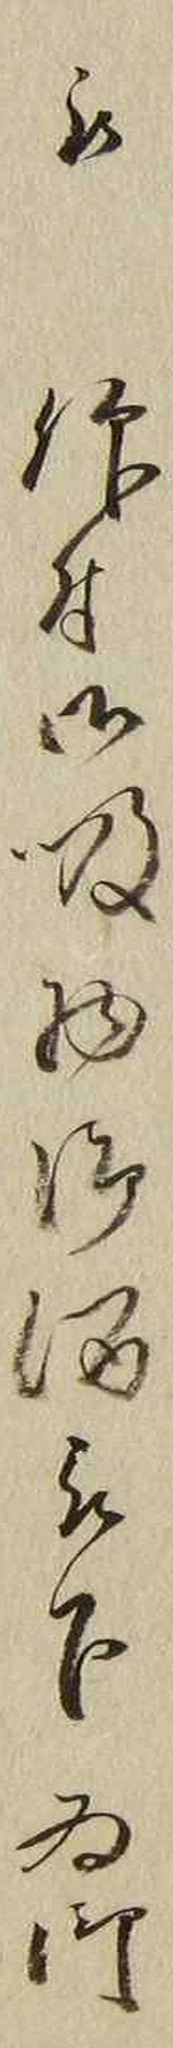被仰付御吸物御酒被下為御
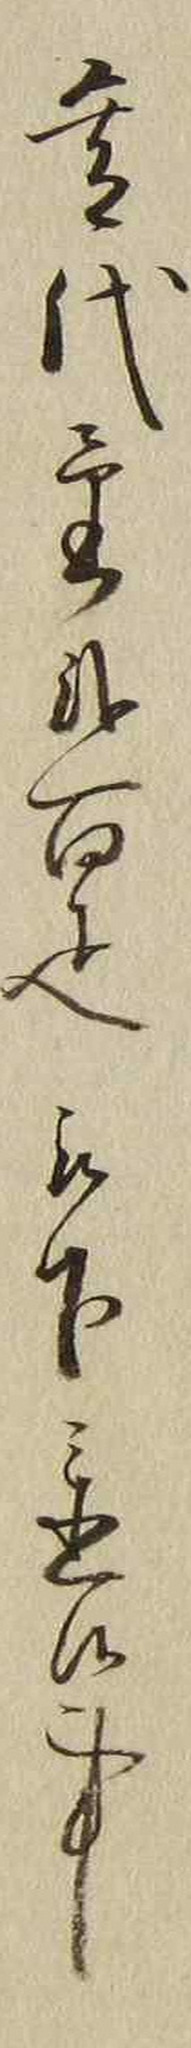肴代金弐百疋被下置候事
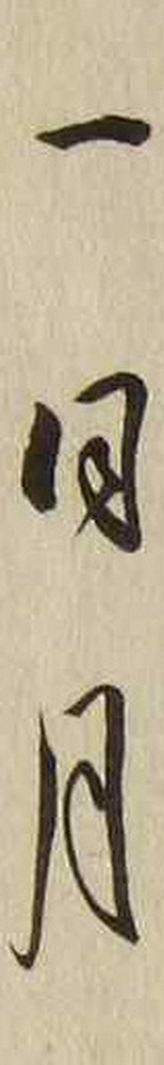一同月

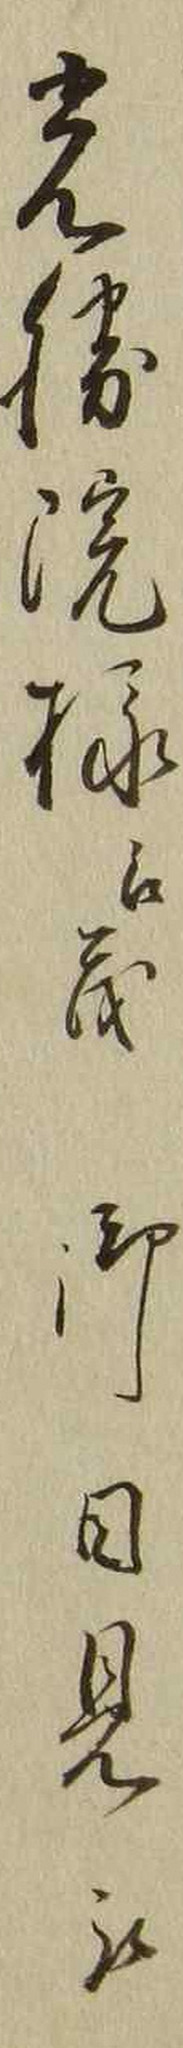光勝院様江茂御目見被
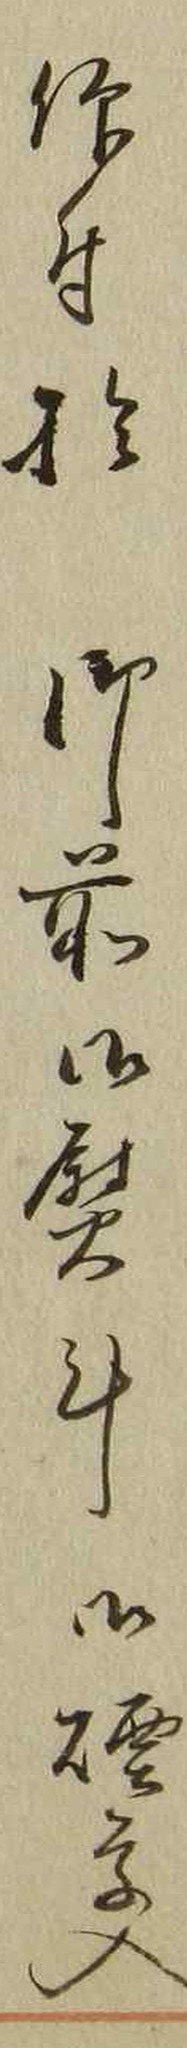仰付於御前御熨斗御煙草入
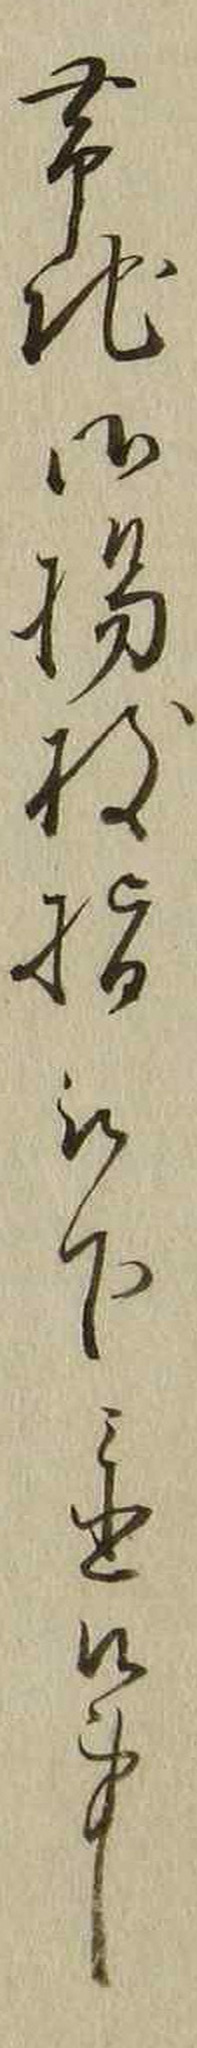帯地御楊枝指被下置候事
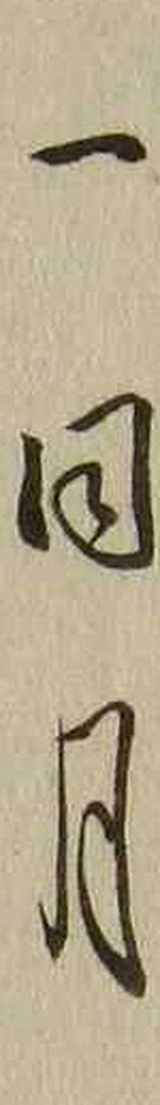一同月
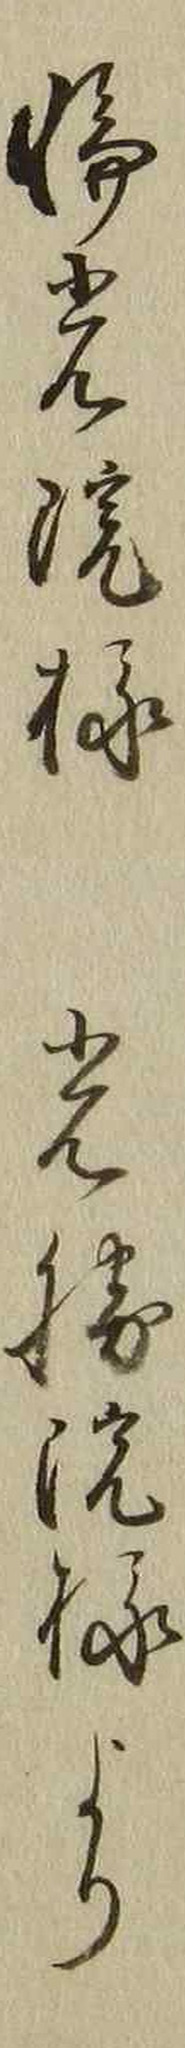輪光院様光勝院様より
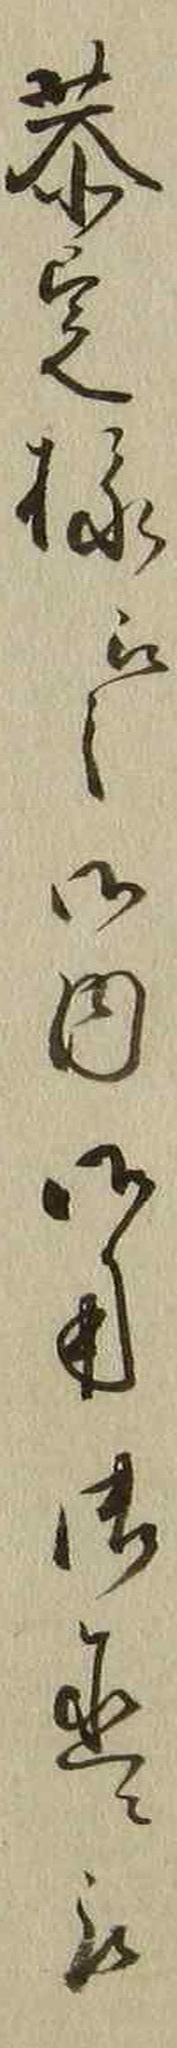恭定様江之御内御用御直ニ被
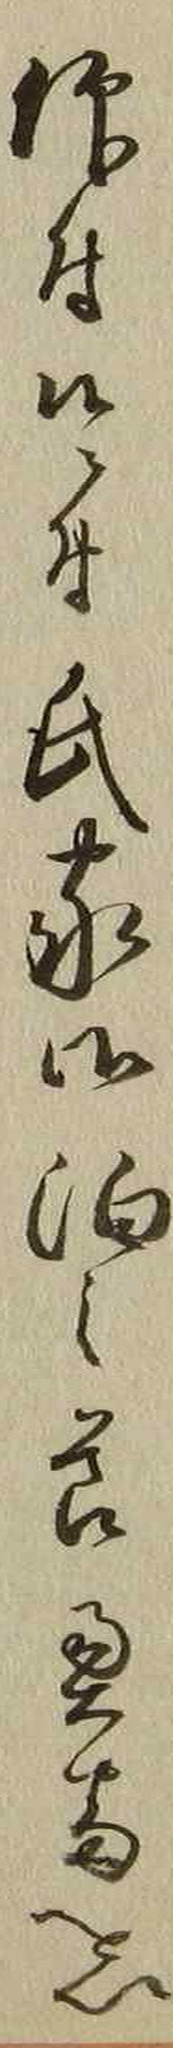仰付候ニ付氏家御泊之節奥番を以
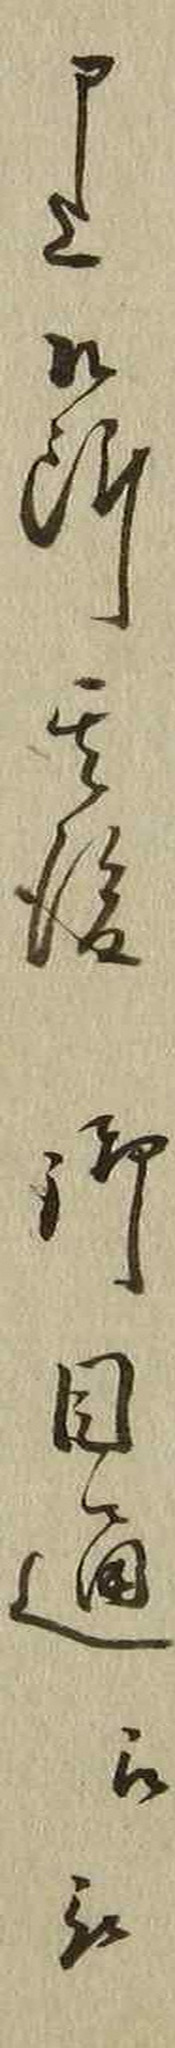申上候所其後御目通江被
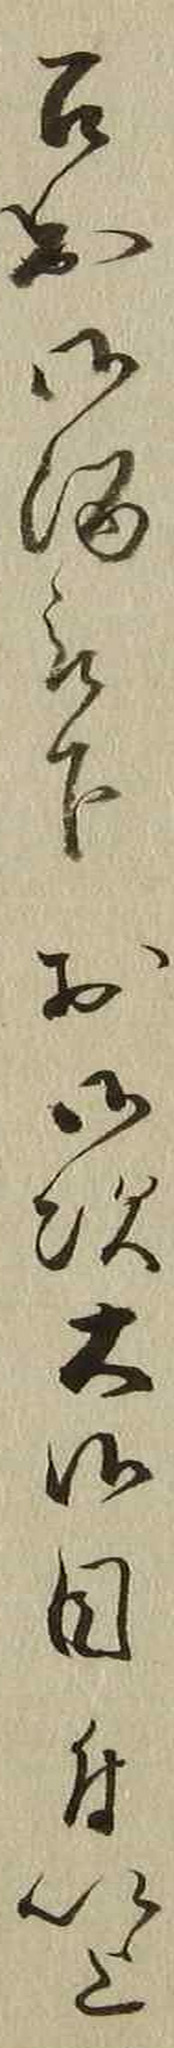召出御酒被下於御次大御目付以上
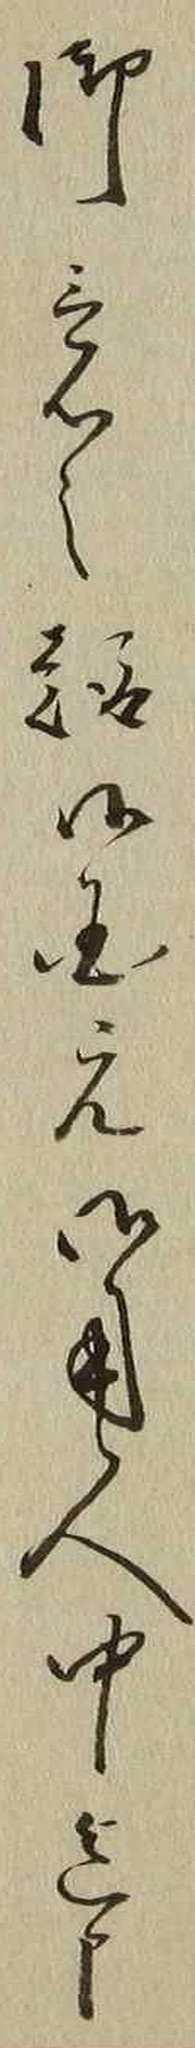御意之趣御国元御用人中迄申
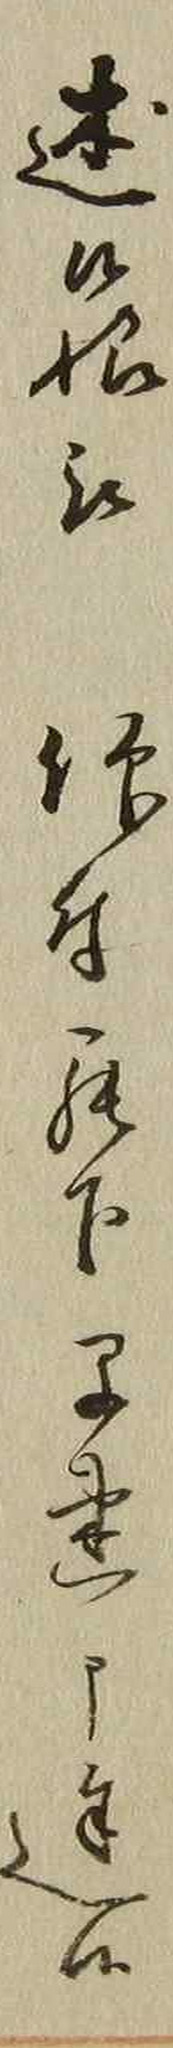述候様被仰付罷下早速申達候
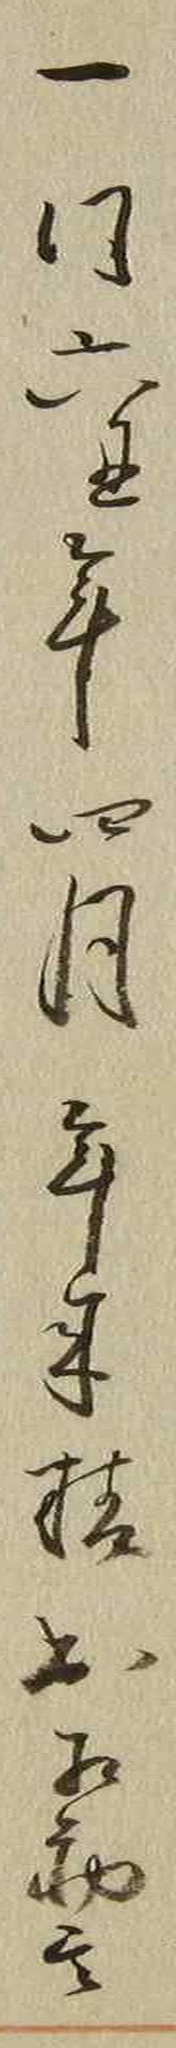一同六丑年四月年来精出相勤其
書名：諸士系譜　巻之68　を之部2
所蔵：会津若松市立会津図書館
